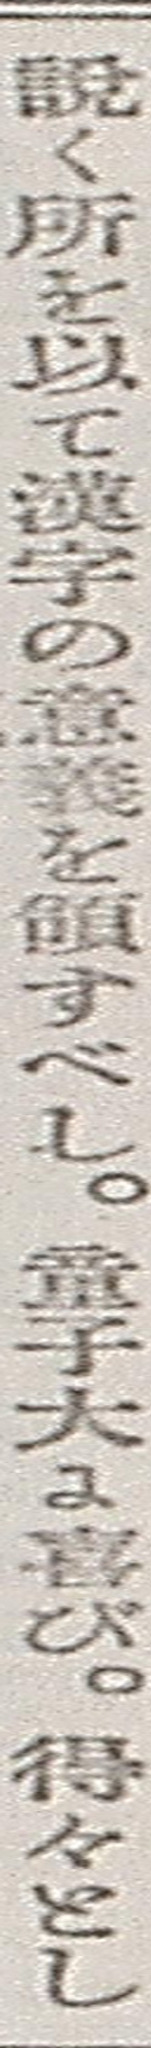説く所を以て漢字の意義を領すべし。童子大に喜び。得々とし
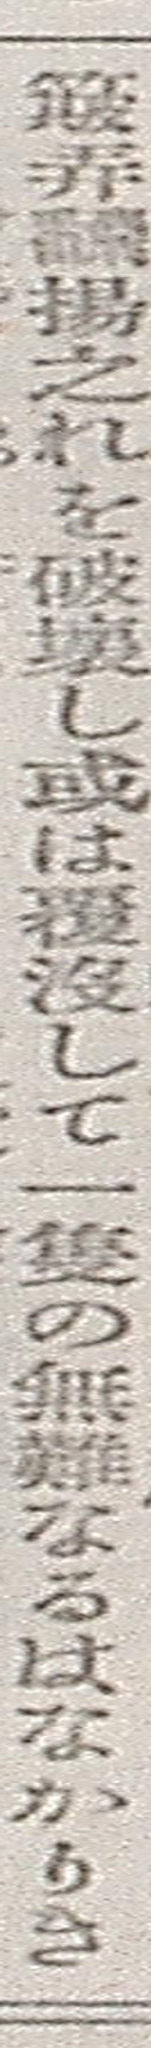簸弄翻揚之れを破壊し或は覆没して一隻の無難なるはなかりき
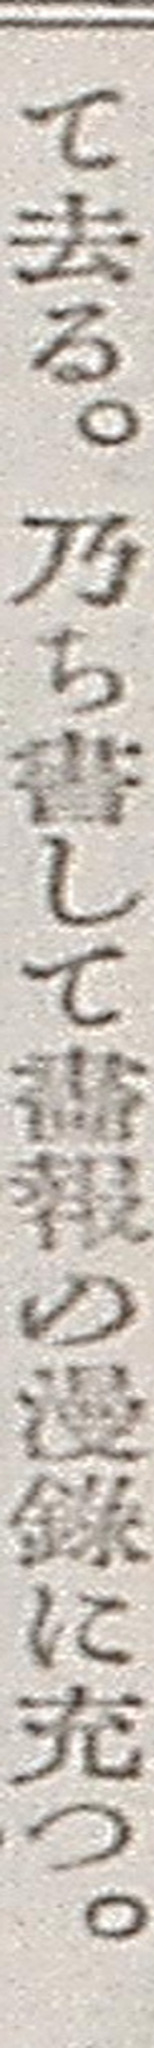て去る。乃ち書して画報の漫録に充つ。
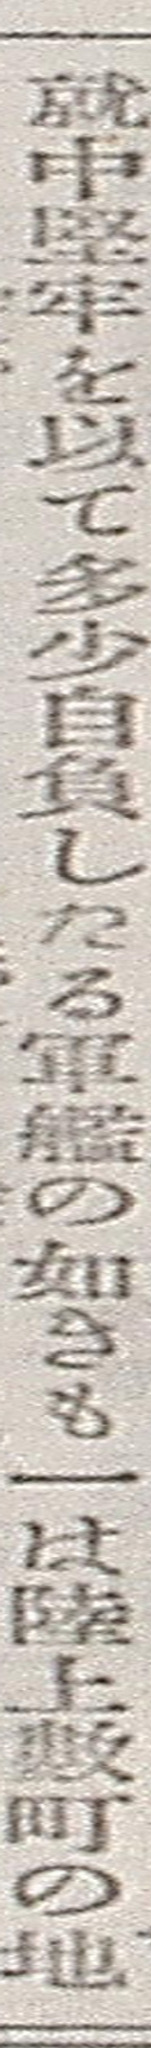就中堅牢を以て多少自負したる軍艦の如きも一は陸上数町の地
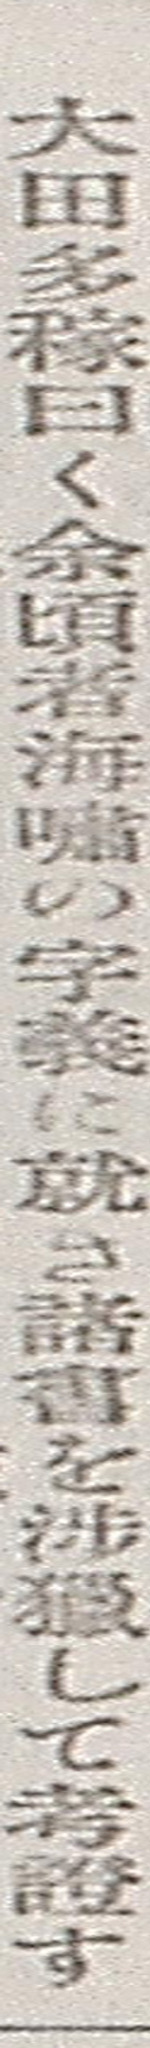大田多稼曰く余頃者海嘯の字義に就き諸書を渉猟して考証す
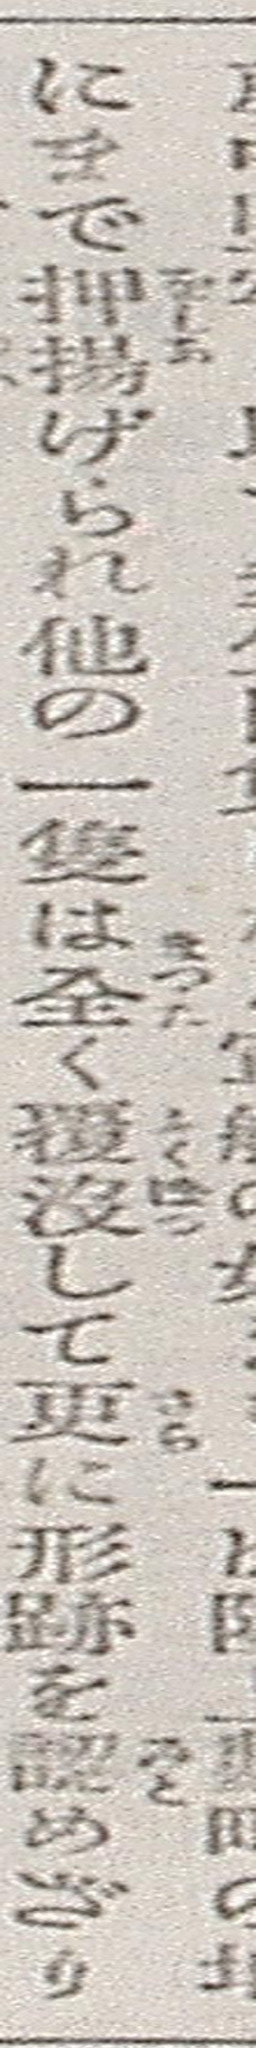にまで押揚げられ他の一隻は全く覆没して更に形跡を認めざり
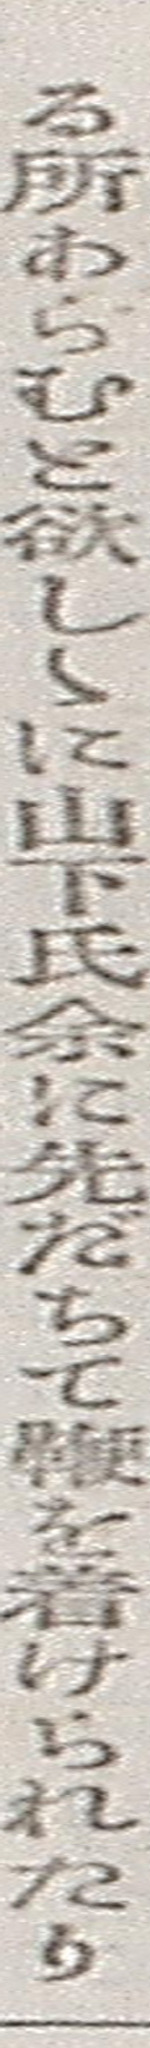る所あらむと欲しゝに山下氏余に先だちて鞭を着けられたり
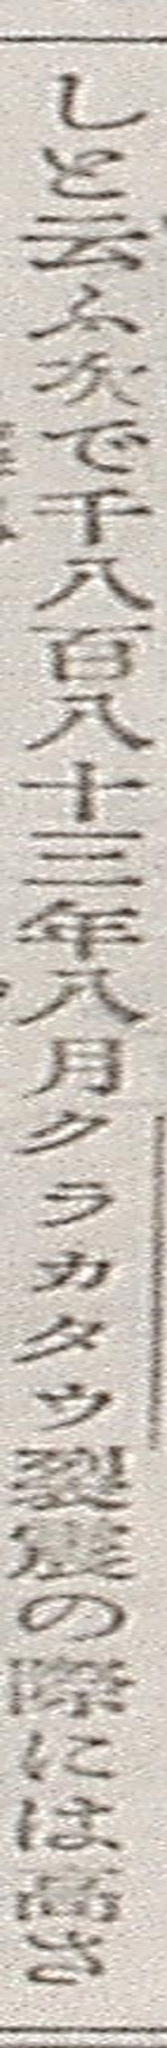しと云ふ次で千八百八十三年八月クラタカツ裂震の際には高さ
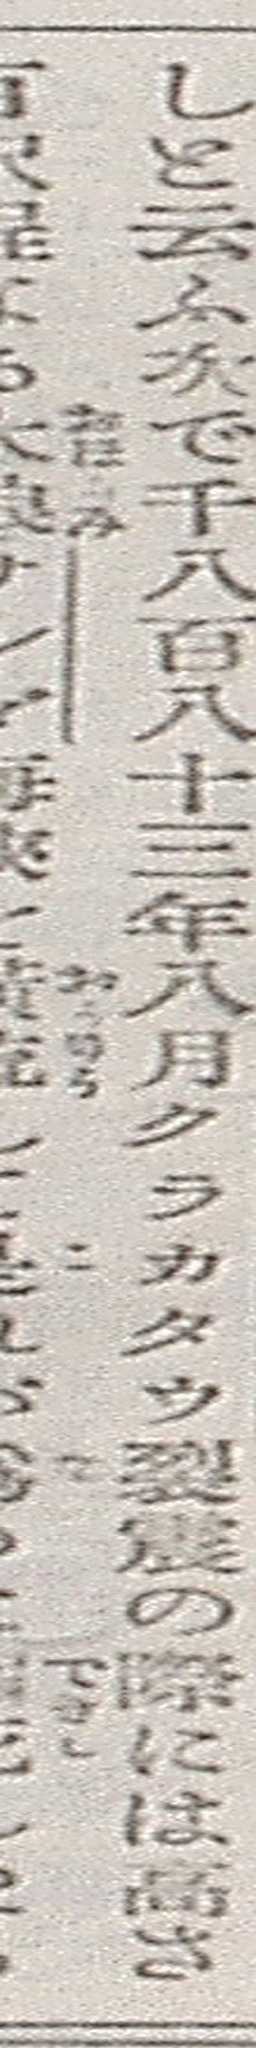百呎程なる大浪サンダ海峡を横流して是れが為めに溺死したる
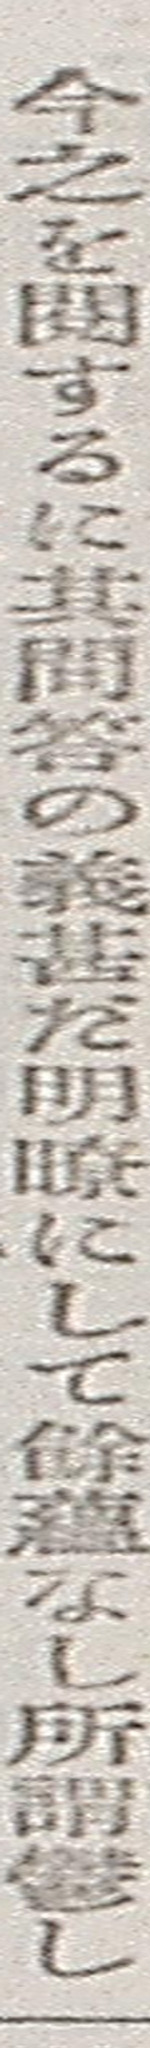今之を閲するに其問答の義甚だ明瞭にして余蘊なし所謂鬱し
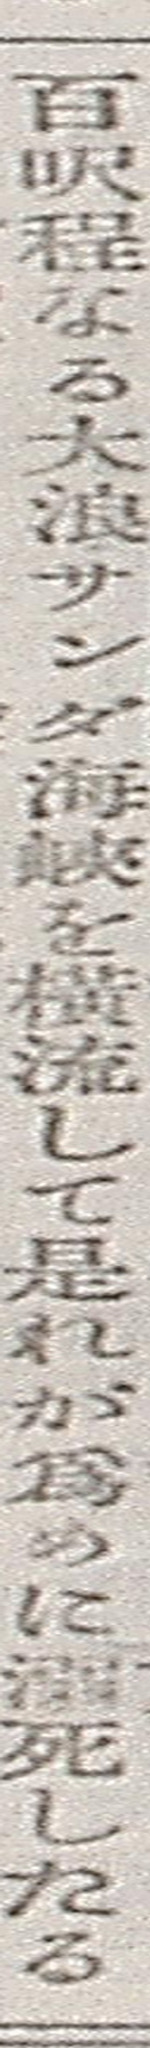百呎程なる大浪サンダ海峡を横流して是れが為めに溺死したる
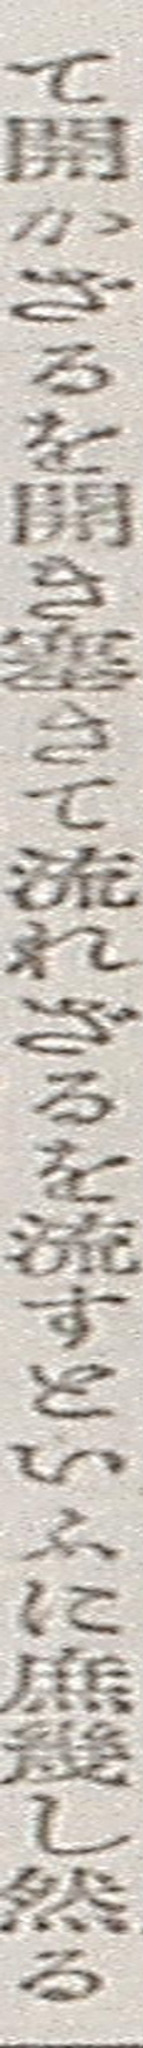て開かざるを開き塞きて流れざるを流すといふに庶幾し然る
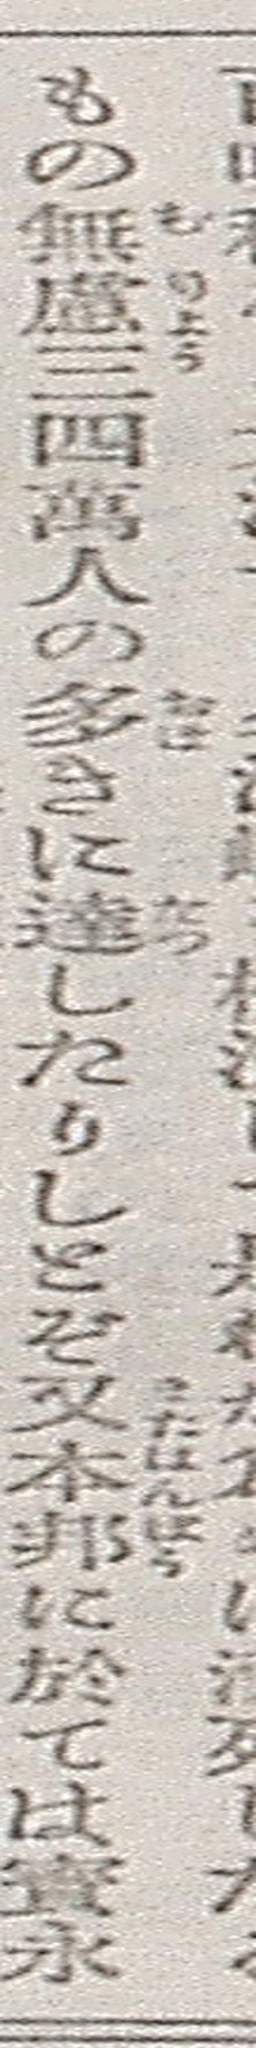もの無慮三四万人の多きに達したりしとぞ又本邦に於ては寛永
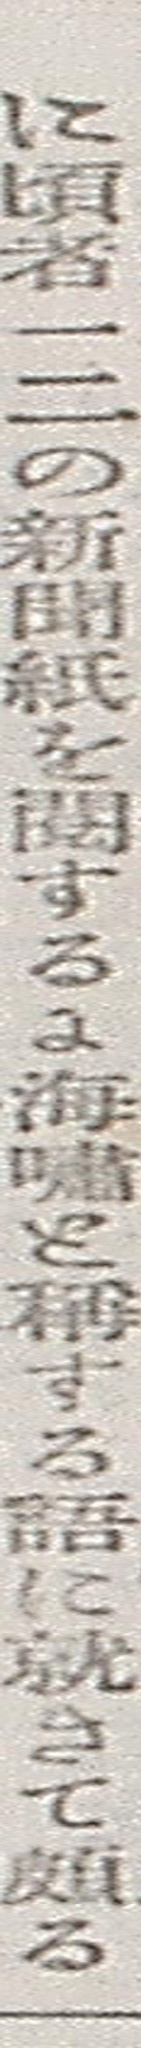に頃者一二の新聞紙を閲するに海嘯と称する語に就きて頗る
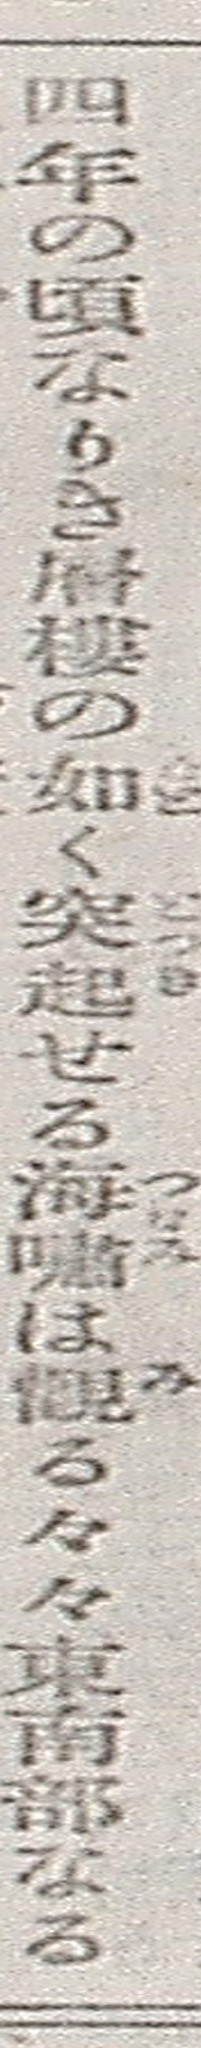四年の頃なりき層樓の如く突起せる海嘯は観る々々東南部なる
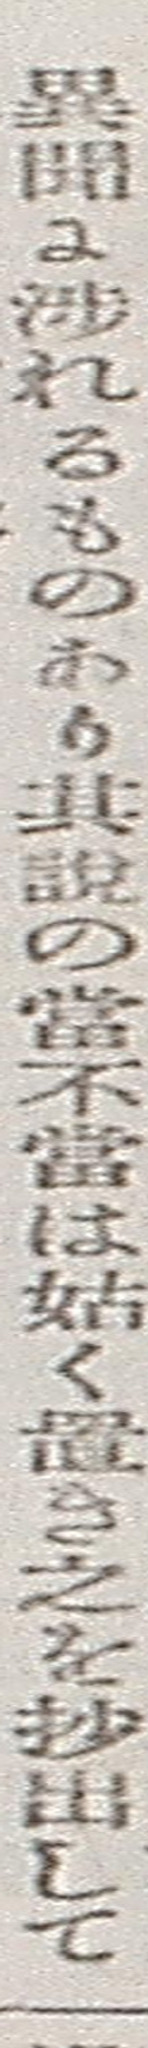異聞に渉れるものあり其説の当不当は姑く置き之抄出して
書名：風俗畫報臨時増刊第百二十號　大海嘯被害録（下）
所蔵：東京大学地震研究所図書室 Earthquake Research Institute Library, The University of Tokyo, JAPAN
